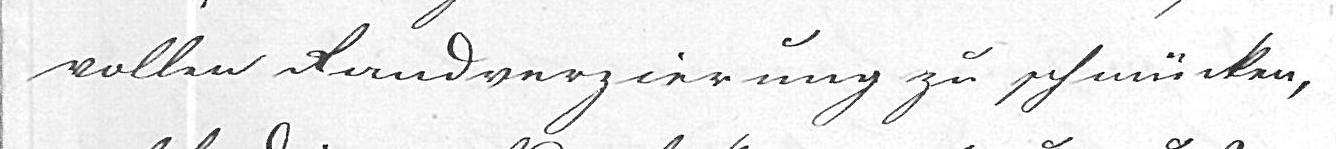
vollem Randverzierung zu schmücken,
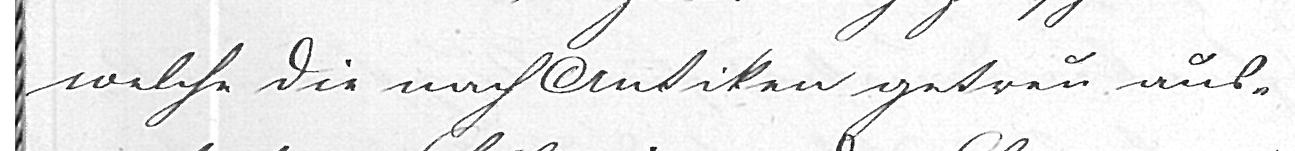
welche die nach Antiken getreu aus-
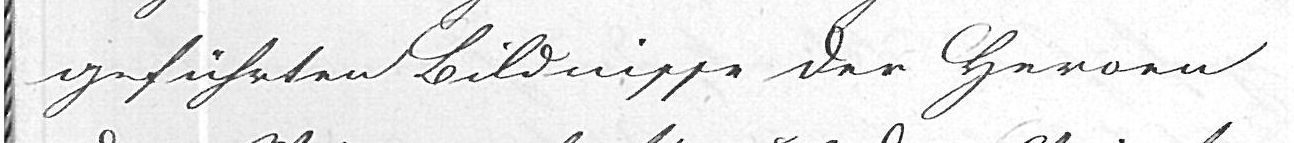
geführten Bildnisse der Heroen
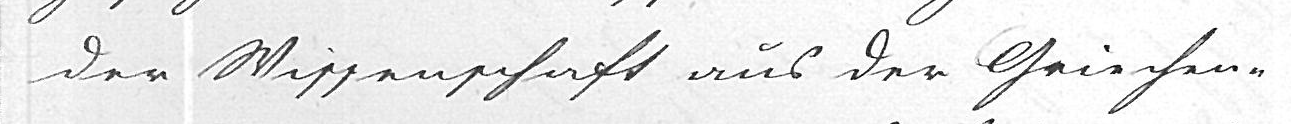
der Wissenschaft aus der Griechen-
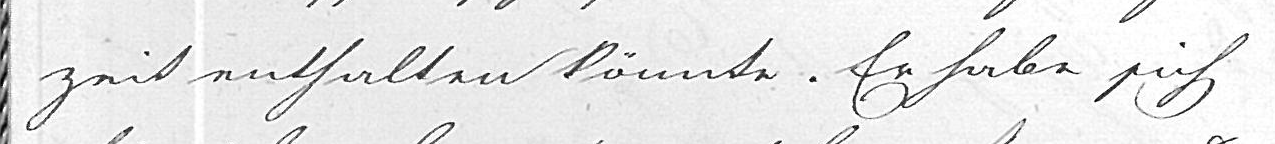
zeit enthalten könnte .Er habe sich
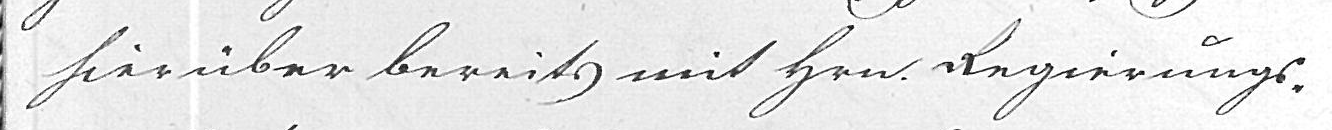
hierüber bereits mit Hrn. Regierungs--
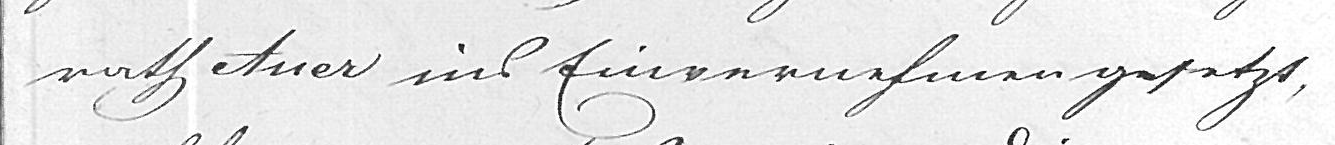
rath Auer ins Einvernehmen gesetzt,
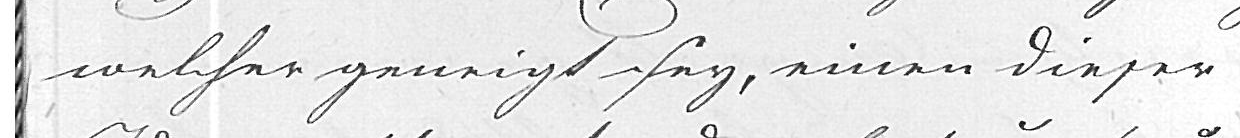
welcher gezeigt sey, einen dieser
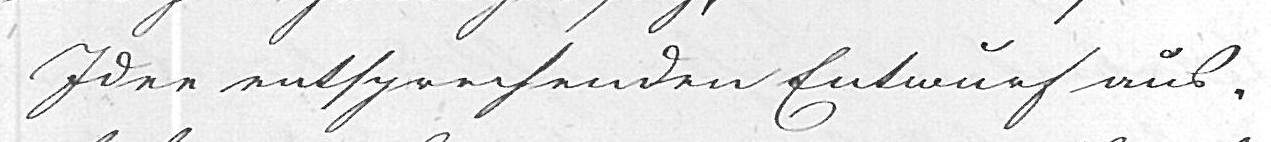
Idee entsprechenden Entwurf aus-
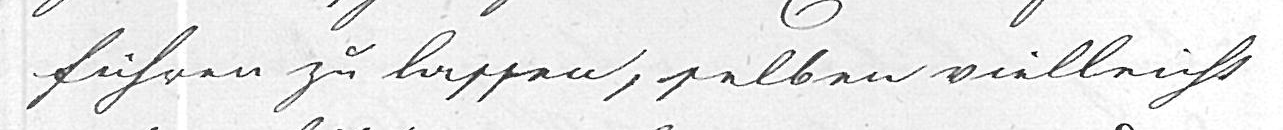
führen zu lassen, selben vielleicht
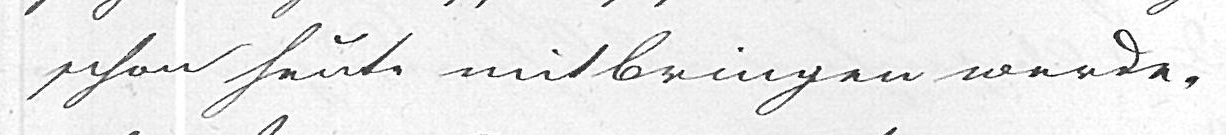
schon heute mitbringen werde.
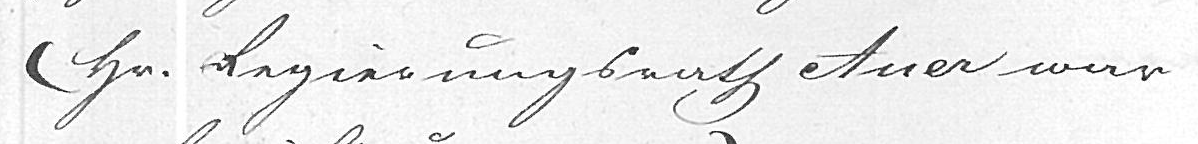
(Hr. Regierungsrath Auer war
